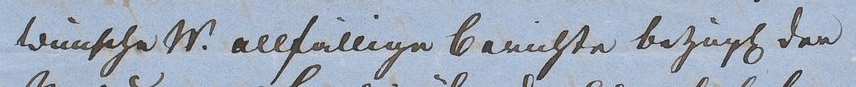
Wünsche W. allfällige Berichte bezügl der
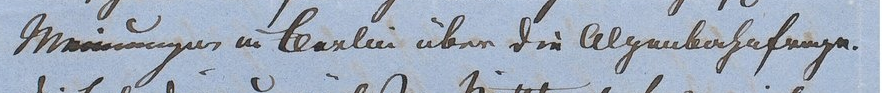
Meinungen in Berlin über die Alpenbahnfrage.
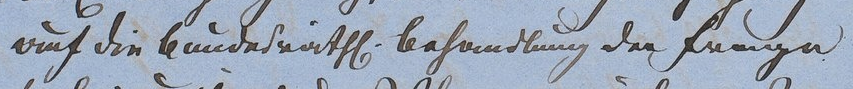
auf die bundesräthl. Behandlung der Frage
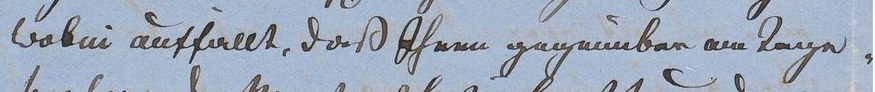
wobei auffällt, daß Ihnen gegenüber am Tage
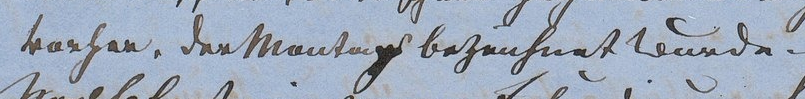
vorher, der Montag bezeichnet wurde. –
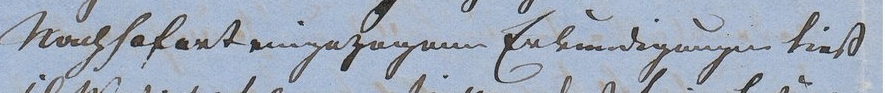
Nach sofort eingezogenen Erkundigungen ließ
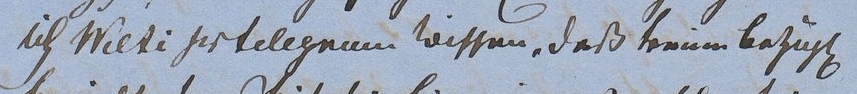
ich Welti pr Telegrmm wissen, daß keine bezügl
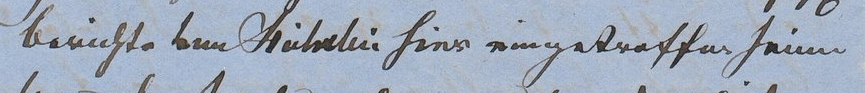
Berichte von Stähelin hier eigetroffen seien
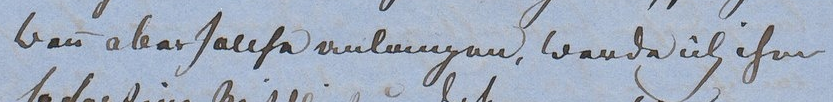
wenn aber solche anlangen, werde ich ihm
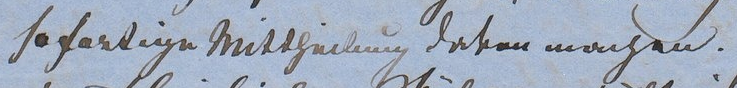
sofortige Mittheilung davon machen.
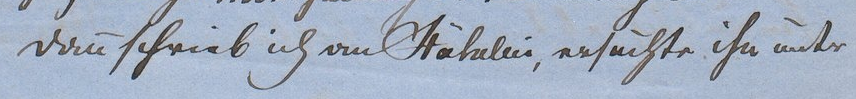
Dann schrieb ich an Stähelin, ersuchte ihn unter
